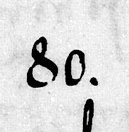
800.
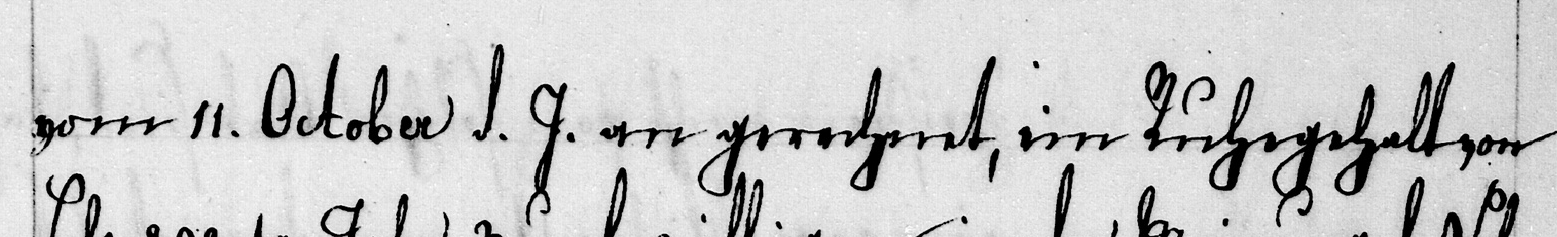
vom 11. October d. J. an gerechnet, ein Ruhegehalt von
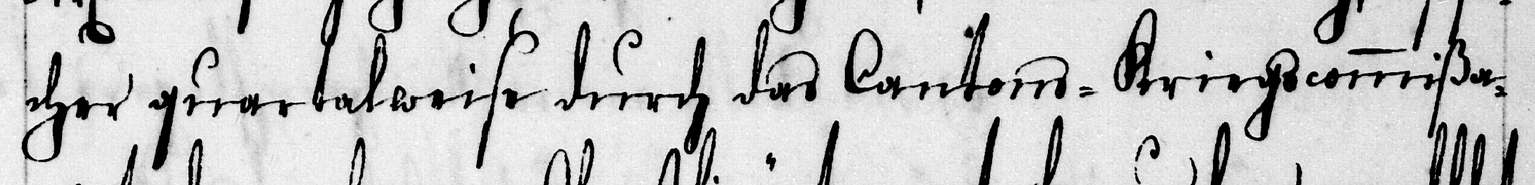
cher quartalweise durch das Cantons-Kriegscomißa¬
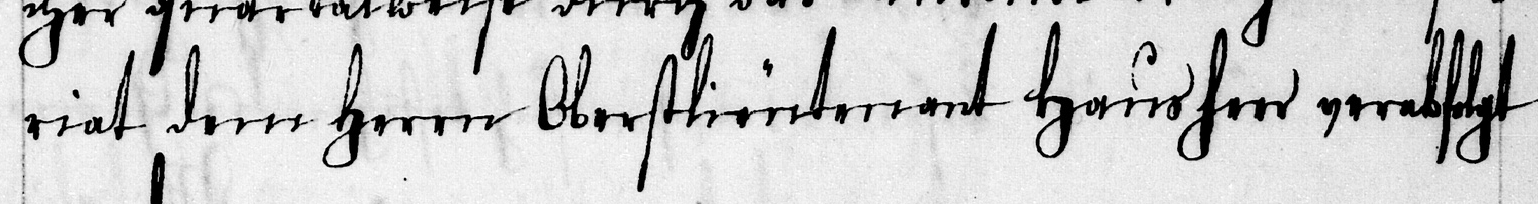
riat dem Herrn Oberstlieutenant Hausheer verabf¬
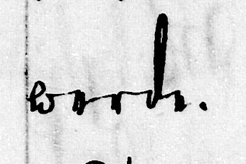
werde.
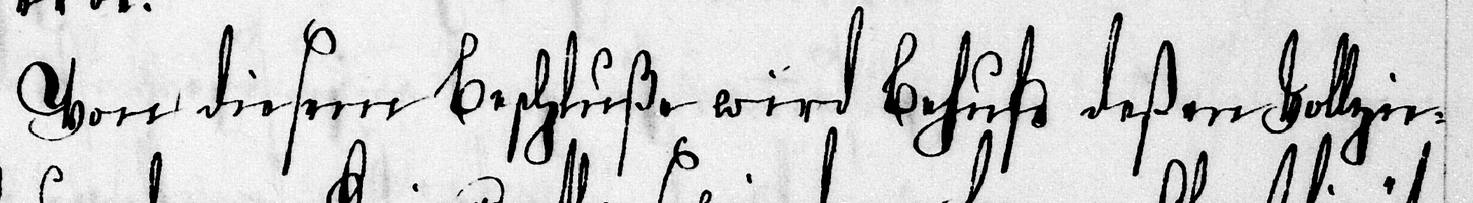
Von diesem Beschluße wird Behufs deßen Vollzi¬
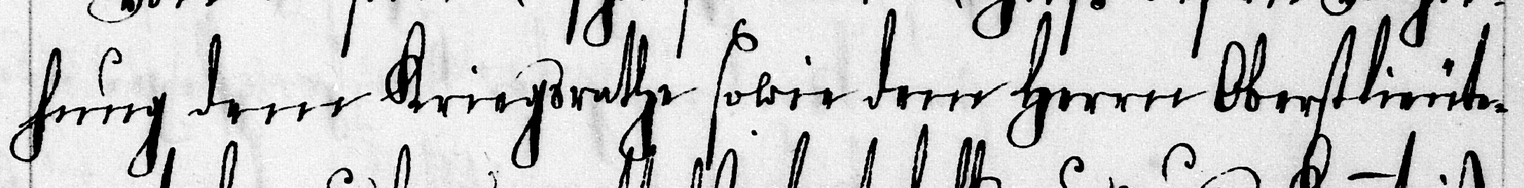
ehung dem Kriegsrathe sowie dem Herrn Oberstlieute¬
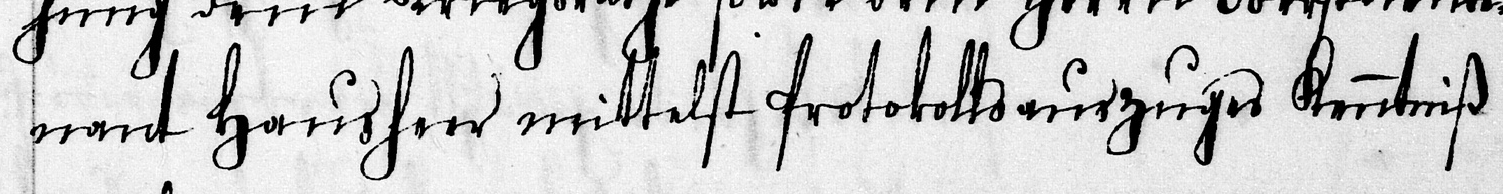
nant Hausheer mittelst Protokollsauszuges Kenntniß
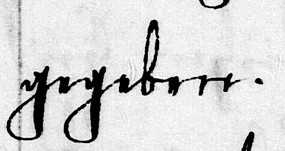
gegeben.
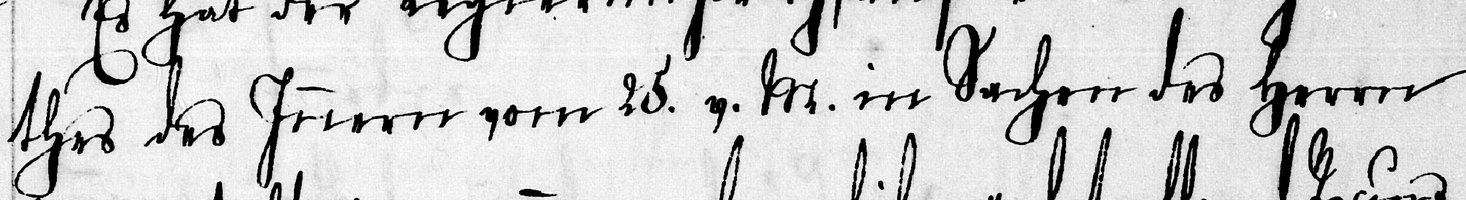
thes des Innern vom 25. v. M. in Sachen des Herrn
